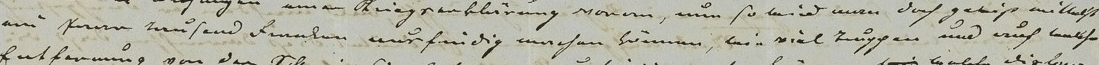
ein Paar Tausend Franken ausfindig machen können, wie viel Truppen und auf welche
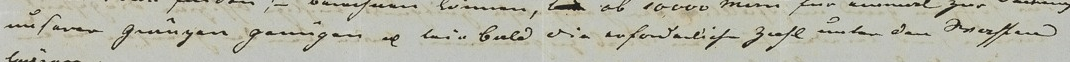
unserer Gränzen genügen u wie bald die erforderliche Zahl unter den Waffen
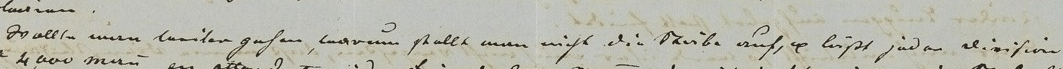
Wollte man weiter gehen, warum stellt man nicht die Stäbe auf, u lässt jeder Division
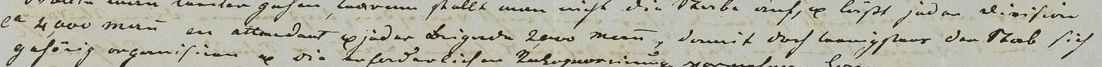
ca 4,000 Mann en attendant u jeder Brigade 2,000 Mann, damit doch wenigstens der Stab sich
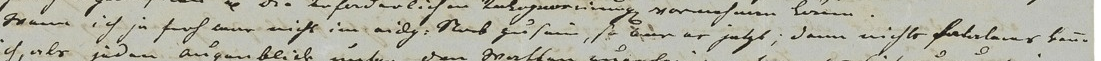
Wenn ich je froh war nicht im eidg: Stab zu sein, so war es jetzt; dann nichts fataleres kenne
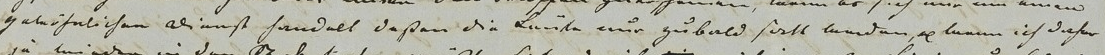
gewöhnlichen Dienst handelt deßen die Leute nur zu bald satt werden, u wenn ich daher
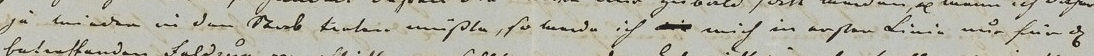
je wieder in den Stab treten müßte, so werde ich ... mich in erster Linie nur für den
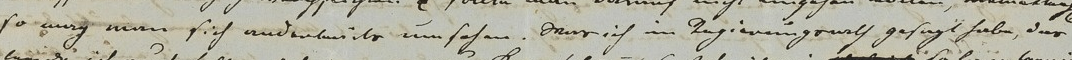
so mag man sich anderwärts umsehen. Was ich im Regierungsrath gesagt habe, das
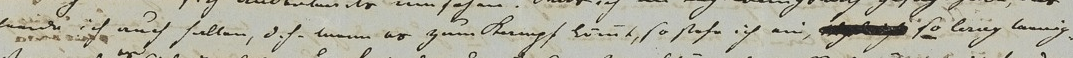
werde ich auch halten, d. h. wenn es zum Kampf kömmt, so stehe ich ein, ... so lang wenig-
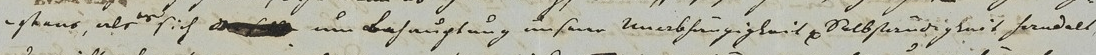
stens, als es sich ... um Behauptung unsrer Unabhängigkeit geht u Selbständigkeit handelt,
